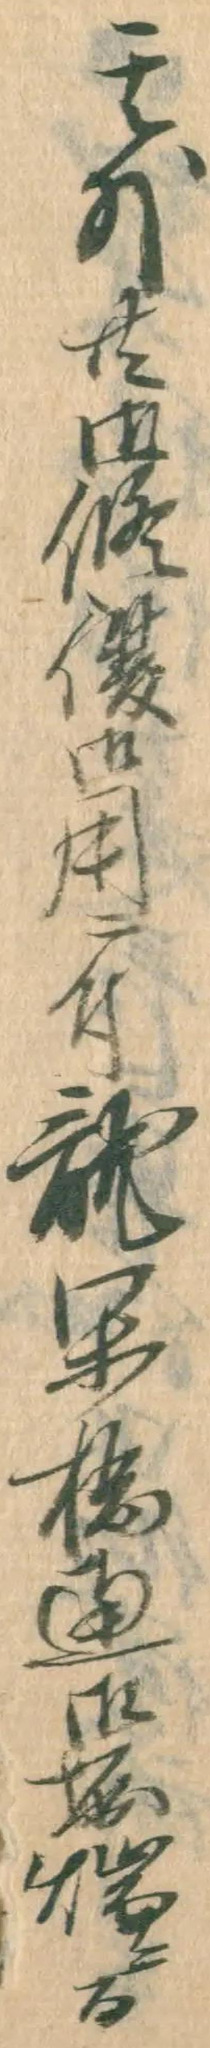其外共御修復御用ニ付龍閑橋通御堀端ニて

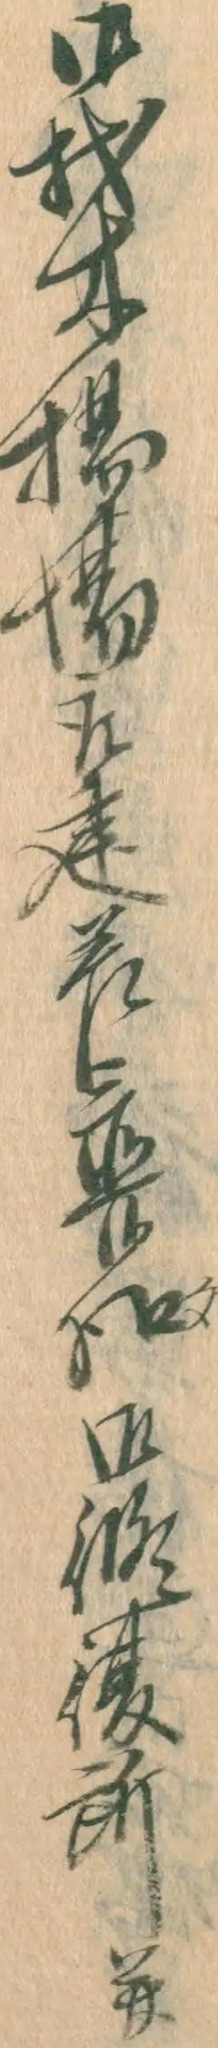御材木揚場取建差置候処御修復所幷
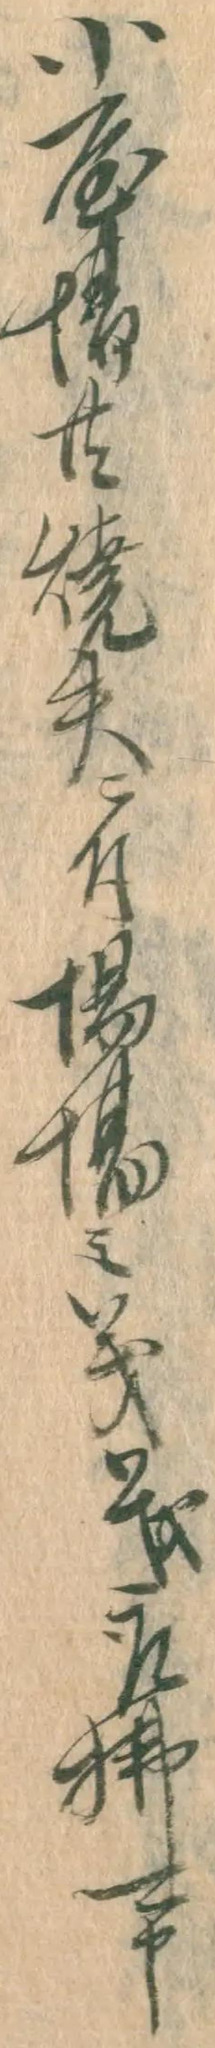小屋場共焼失ニ付揚場之義も取払可申
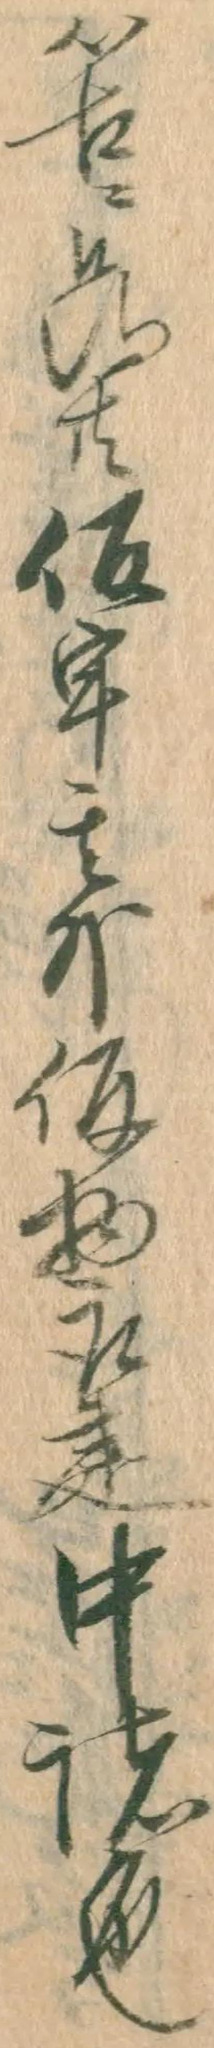筈ニ候得共仮牢其外仮物取建中諸色
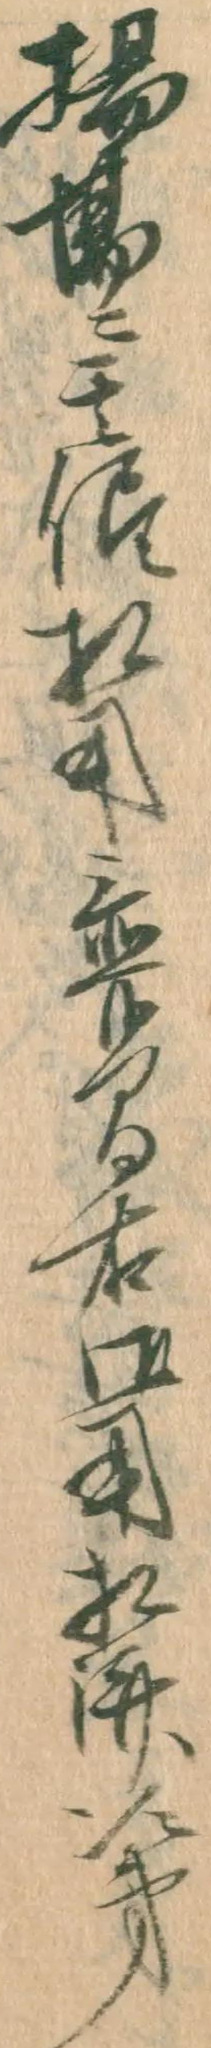揚場ニ其儘相用置候間右御用相済次第
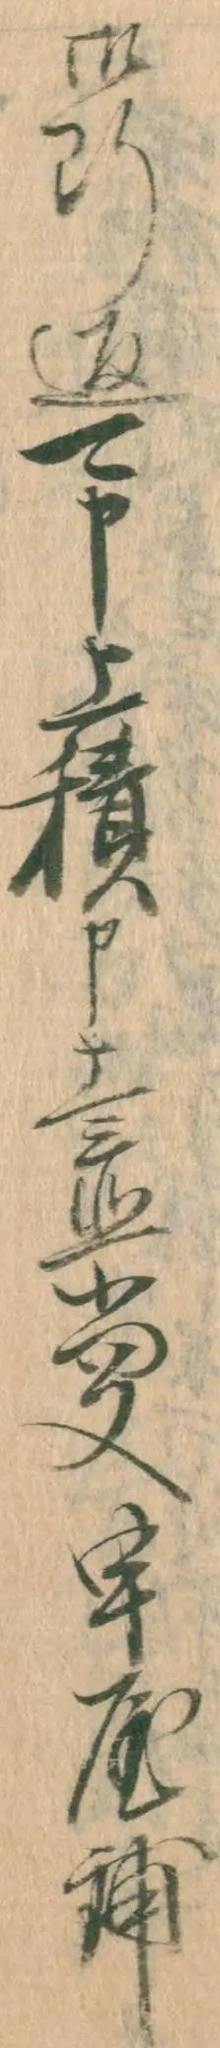御断返可申上積申上置尚又牢屋舗
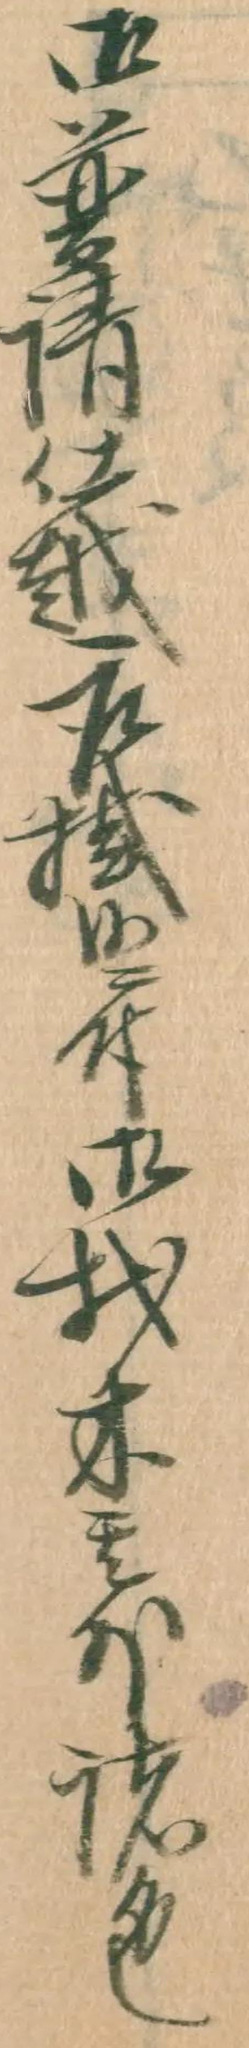御普請仕越取掛候ニ付御材木其外諸色
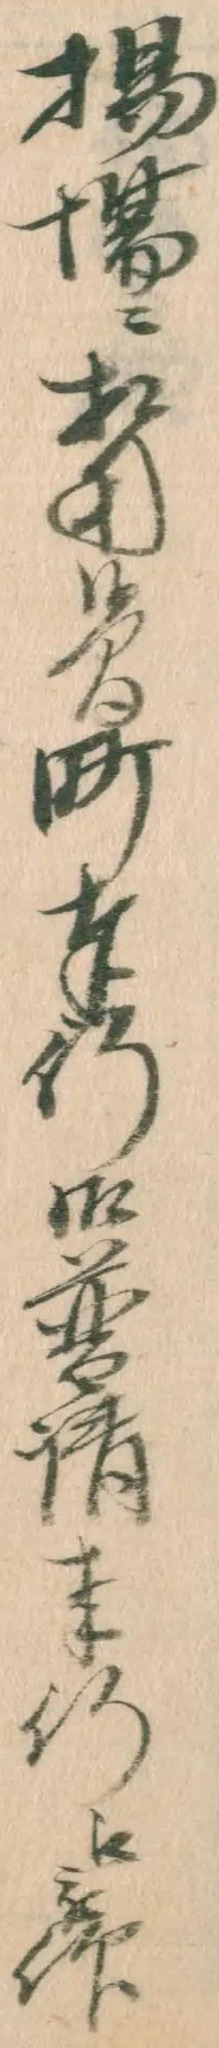揚場ニ相用候間町奉行御普請奉行え被仰
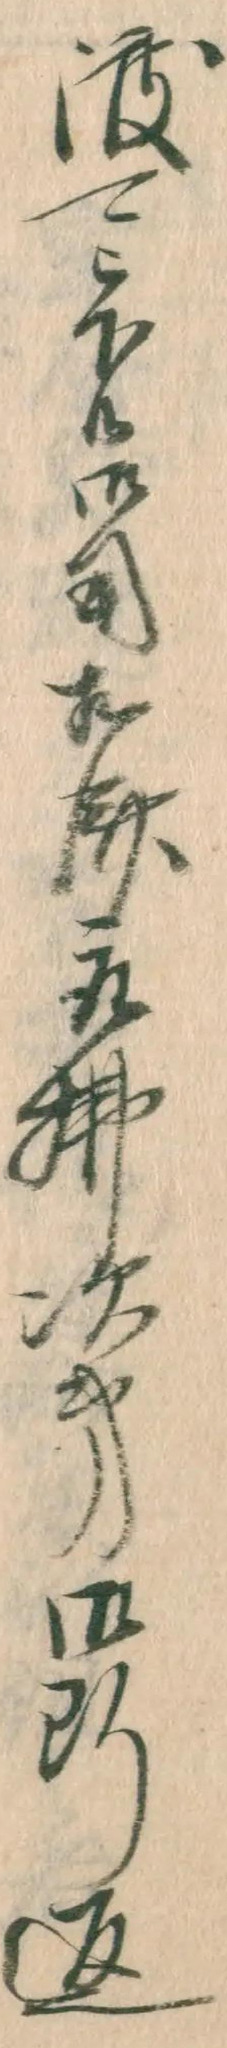渡可被下候御用相済取払次第御断返
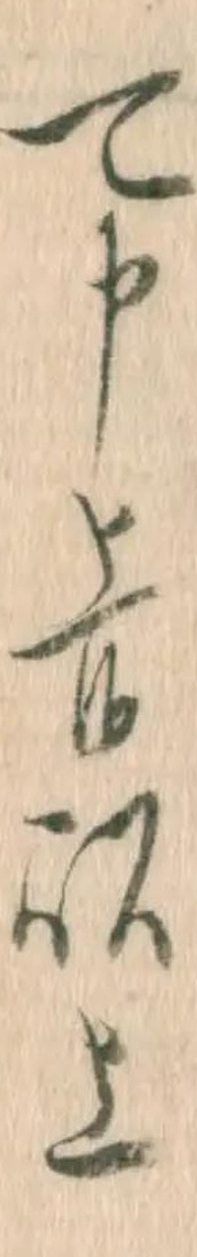可申上候以上
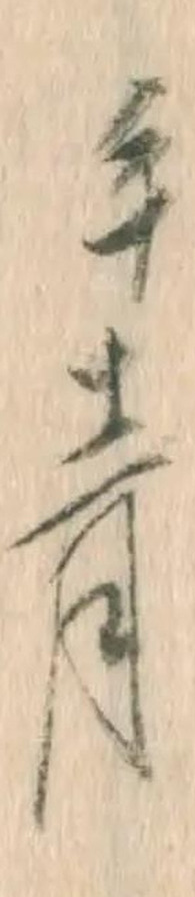午十二月

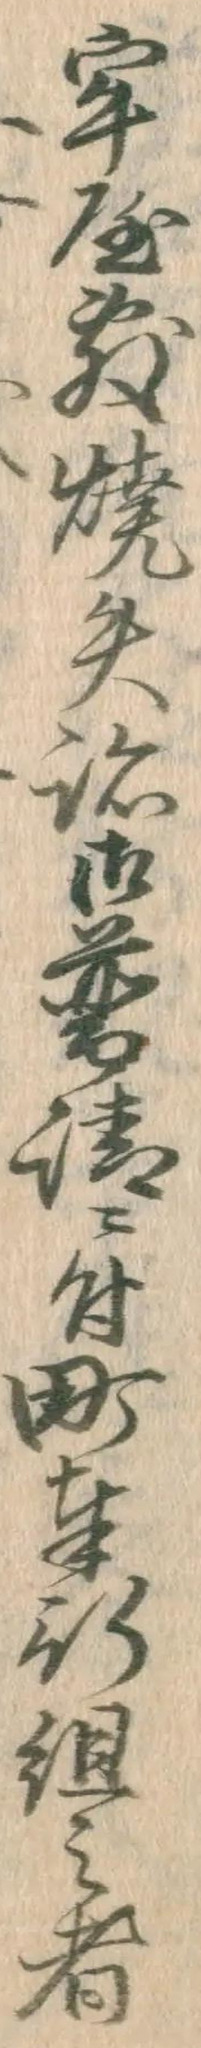│牢屋舗焼失跡御普請ニ付町奉行組之者
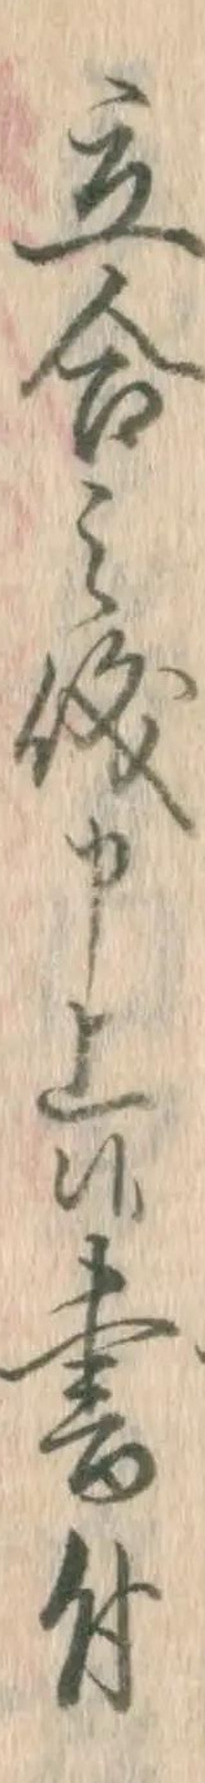│立合之儀申上候書付
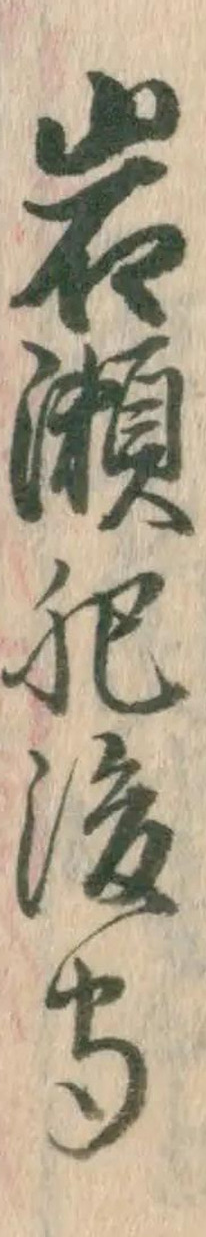│岩瀬肥後守
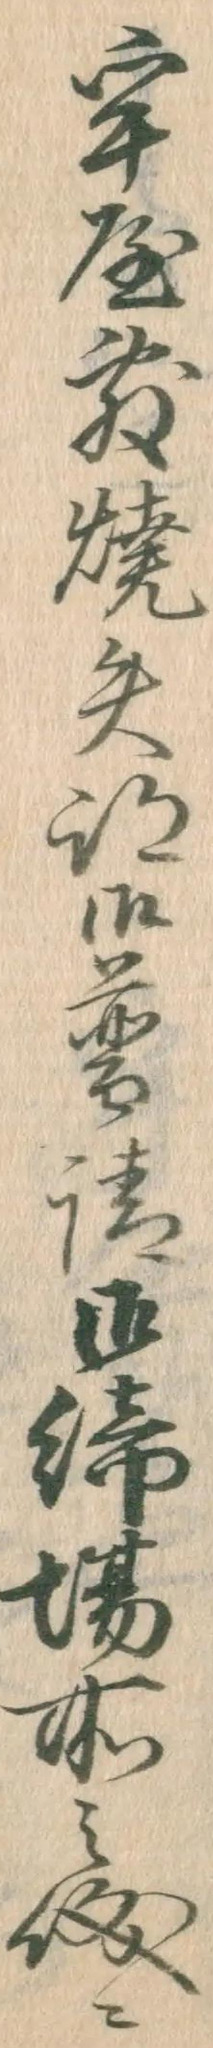牢屋舗焼失跡御普請御締場所之儀ニ
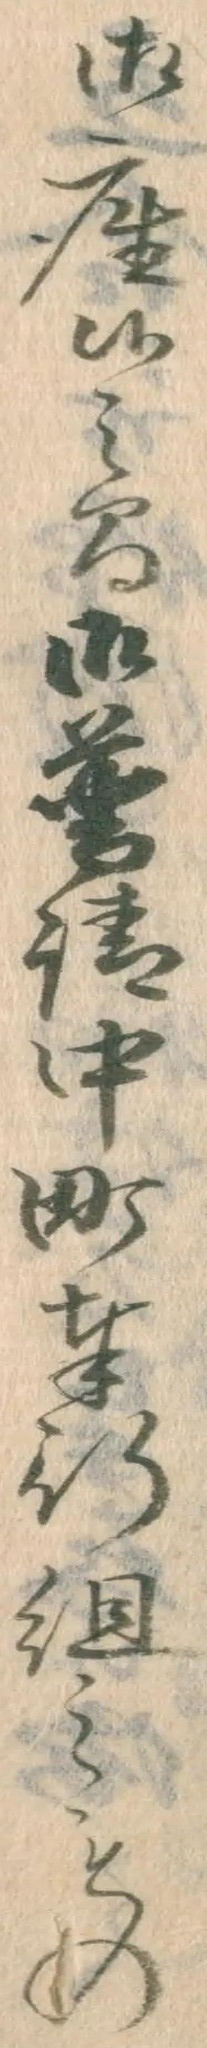御座候之間御普請中町奉行組之もの
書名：七十冊物類集 71巻. [44] 四十三 牢屋敷御普請御修覆地震ニ付骨折候牢屋掛御褒美之部
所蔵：国立国会図書館 National Diet Library, JAPAN
